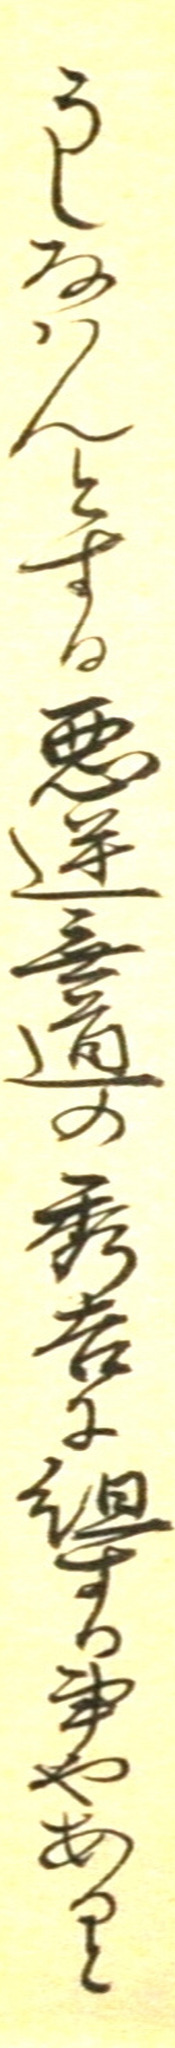うしなはんとする悪逆無道の秀吉に組する事やあると
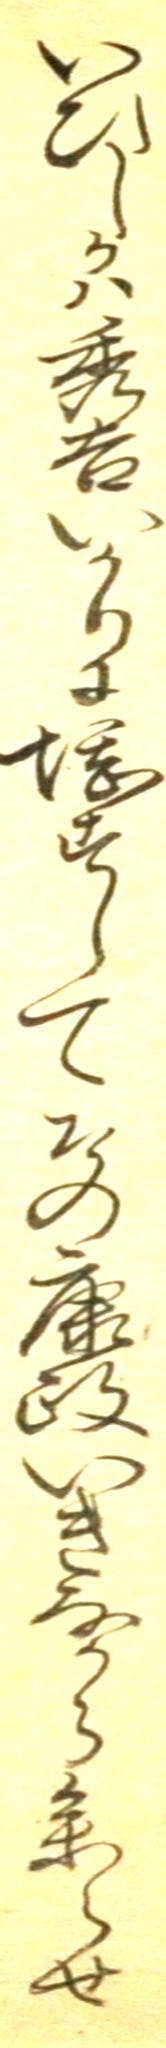いひしかは秀吉いかりに堪すしてその康政いきなから参らせ
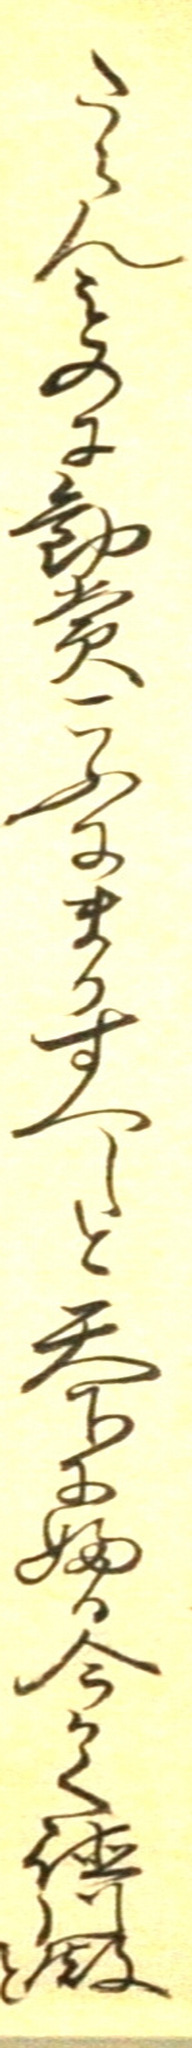たらんものに勧賞こふにまかすへしと天下にふる今かく徳川殿と
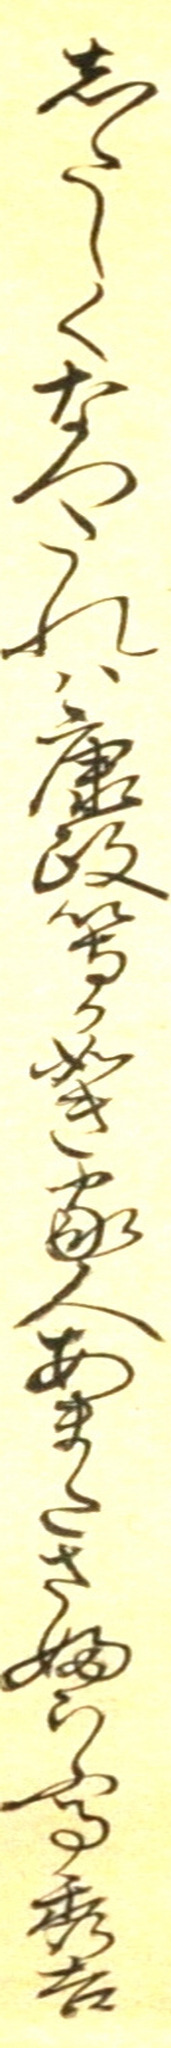したしくなつたれは康政等か如き家人あまたさふらふ事秀吉
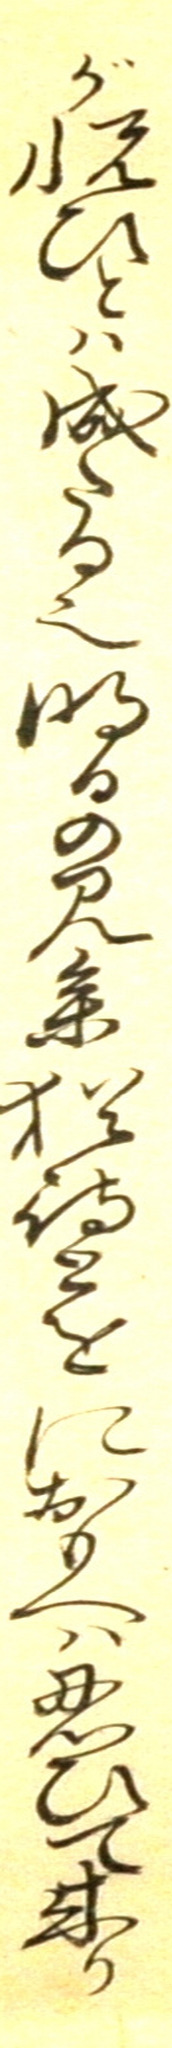が悦ひとは成たる也明日の見参猶待とをにおもへは忍ひて来り
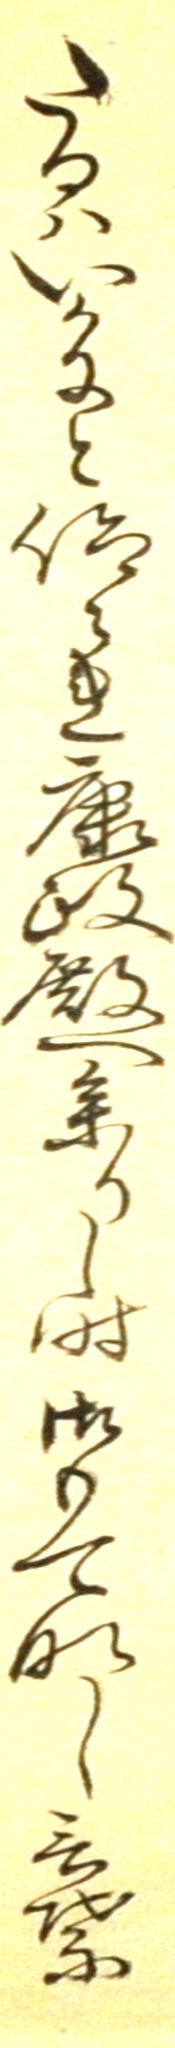たるはいかにと仰られ康政殿へ参りし時御もてなし言葉
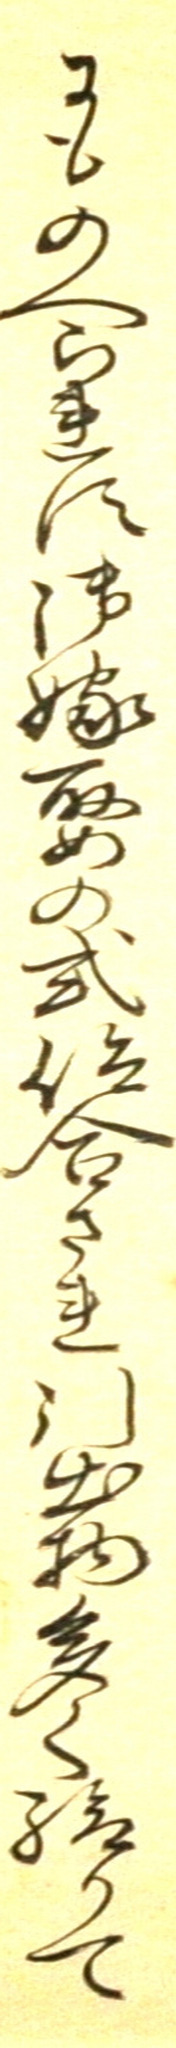にものへられす御嫁娶の式仰合され引出物多く給りて
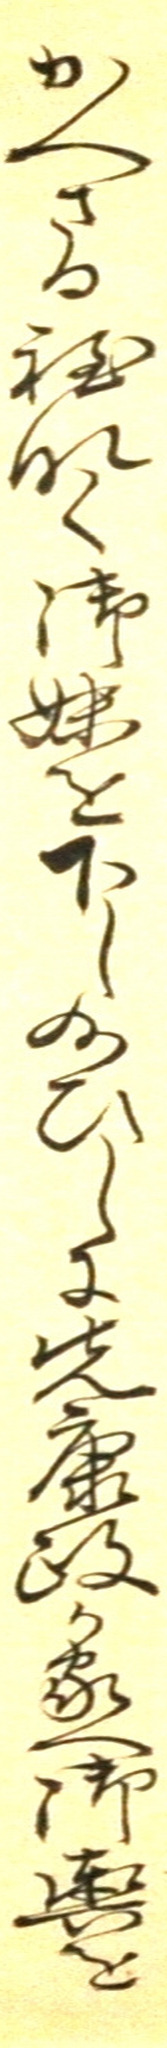かへさる程なく御妹を下し給ひしに先康政か家へ御輿を
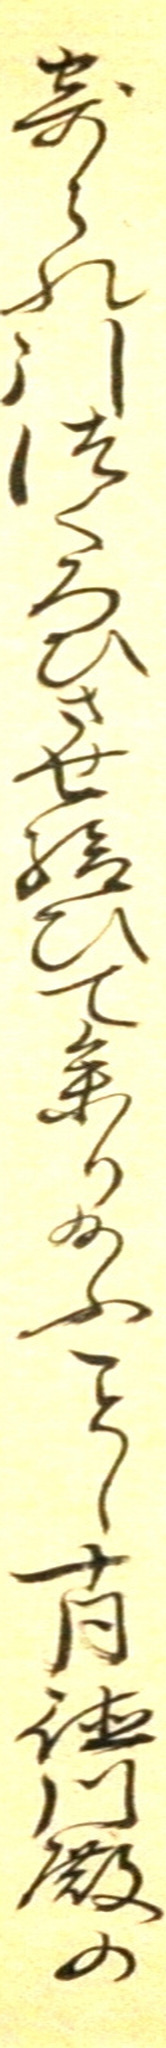寄られ引つくろひさせ給ひて参り給ふことし十月徳川殿の
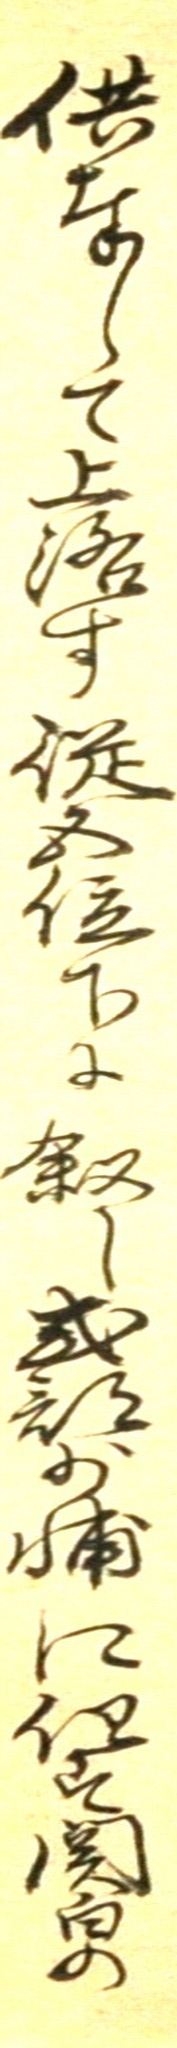供奉して上洛す従五位下に叙し式部少輔に任す関白の
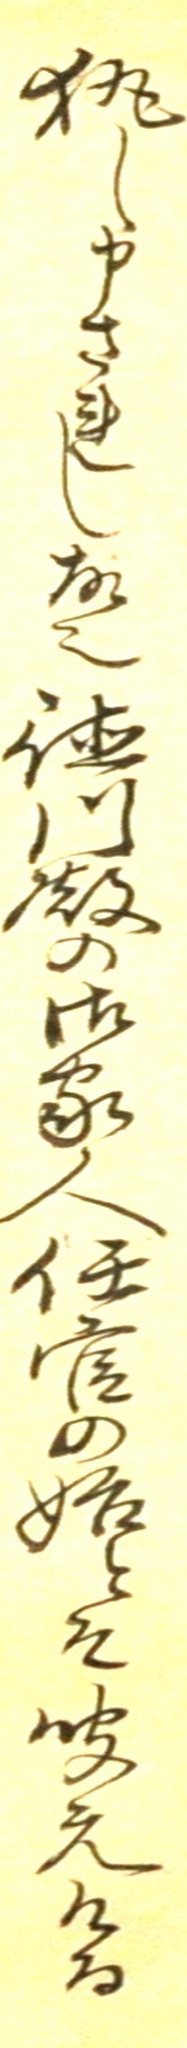執し申されし故也徳川殿の御家人任官の始とそ聞えける

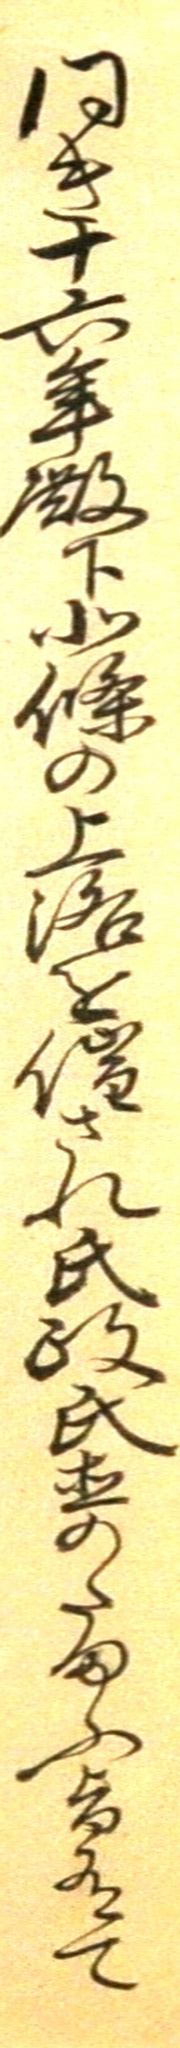同き十六年殿下北条の上洛を催され氏政氏直のたまふ旨有て
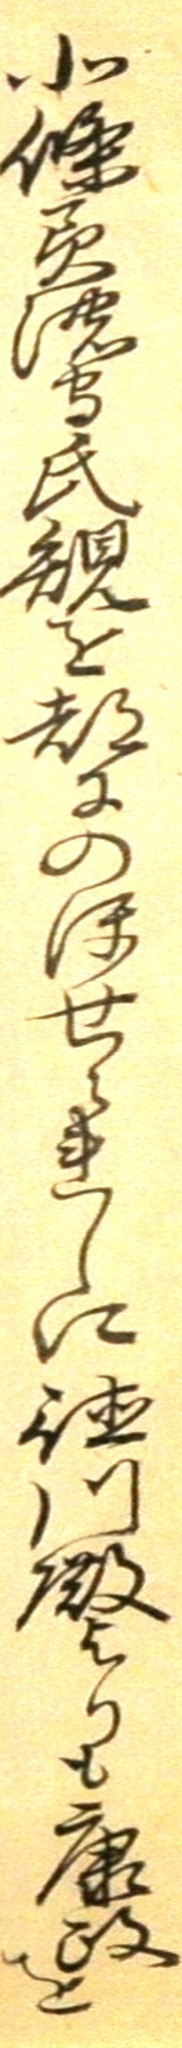北条美濃守氏親を都にもほせられしに徳川殿よりも康政を
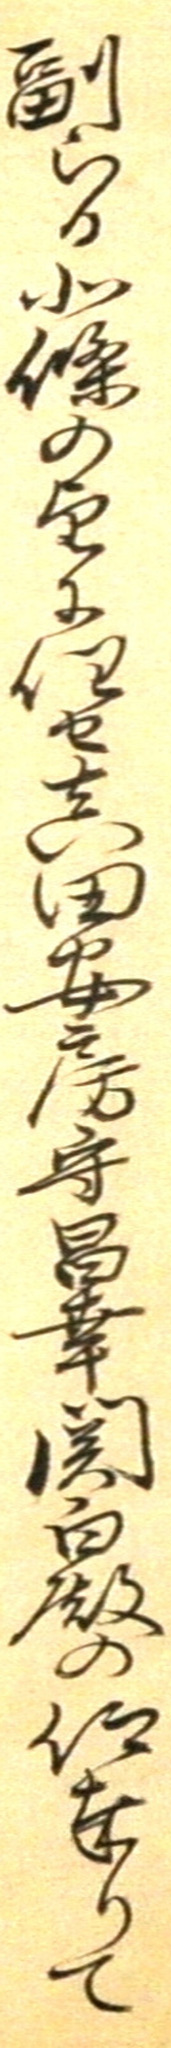副らる北条の望に任せ真田安房守昌幸関白殿の仰奉りて
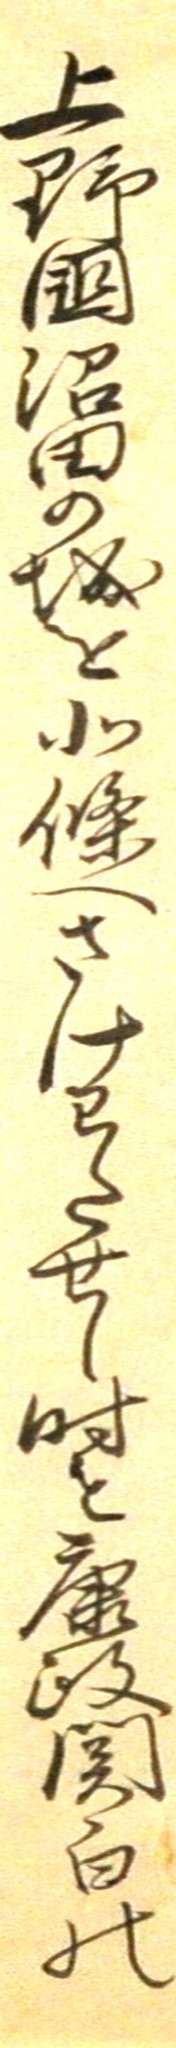上野国沼田の城を北条へさけわたせし時も康政関白の
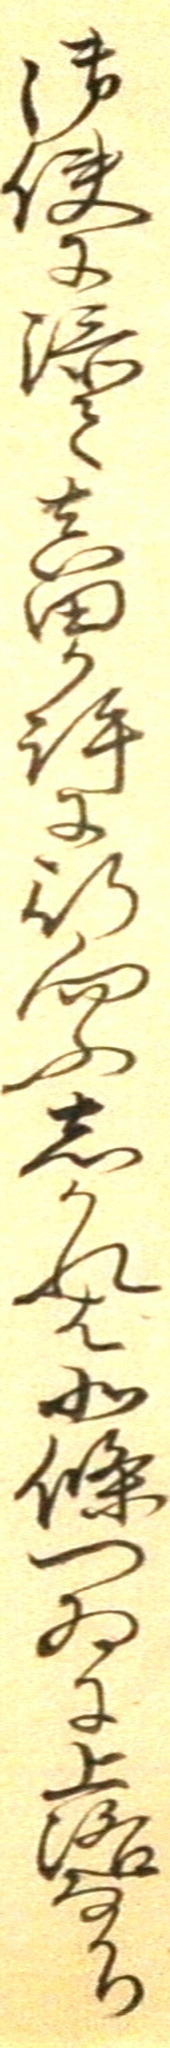御使に添て真田か許に行向ふしかれは北条つゐに上洛なかり
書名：藩翰譜（四・上）
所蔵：伊那市立高遠町図書館・合同会社AMANE
